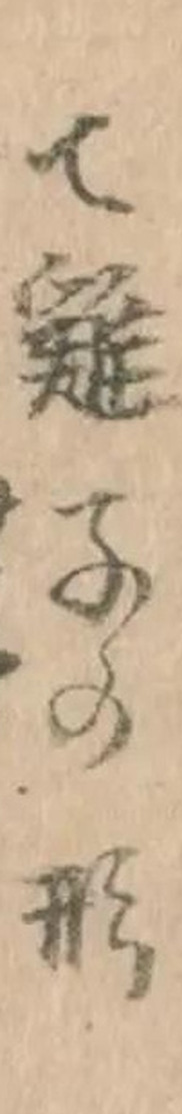て鶏子の形
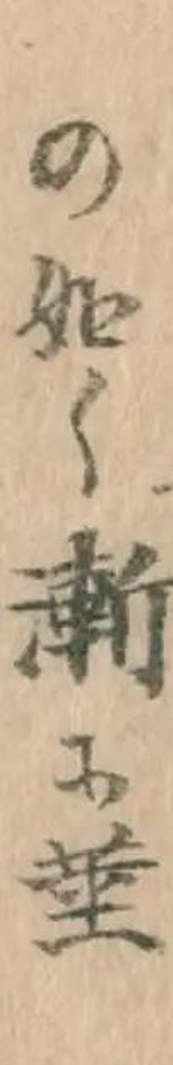の如く漸に茎
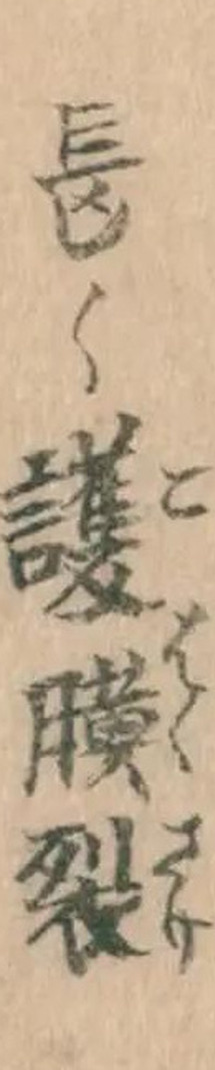長く護膜裂
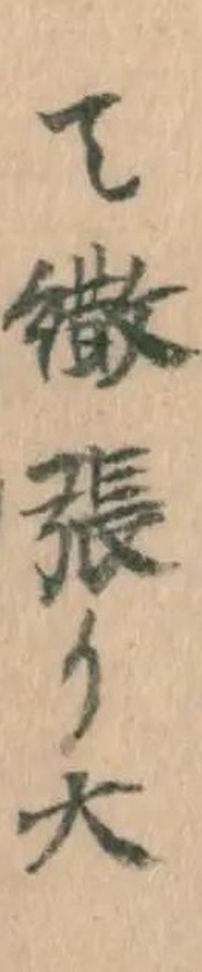て繖張り大
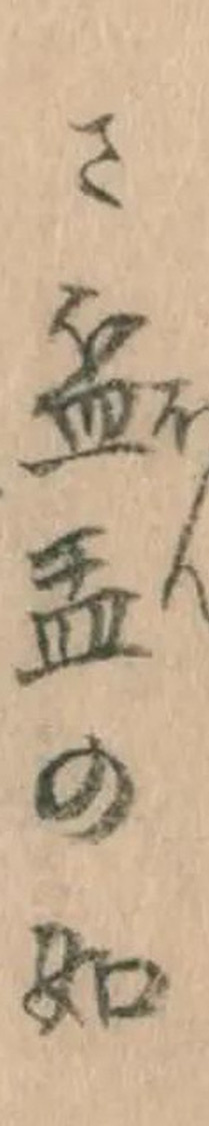さ盆盂の如
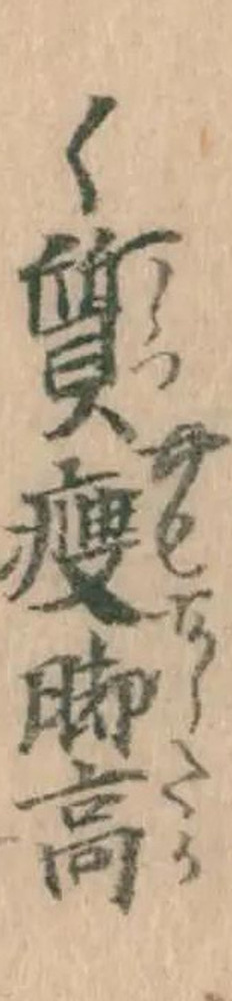く質痩脚高
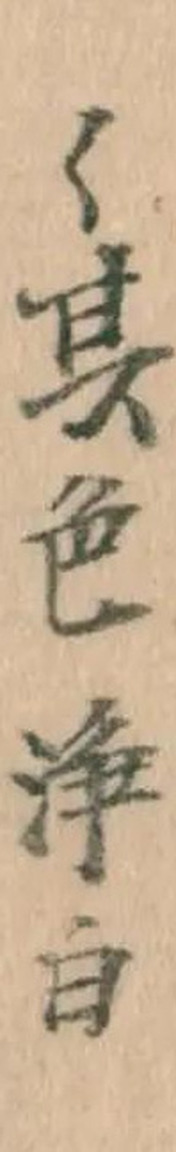く其色浄白
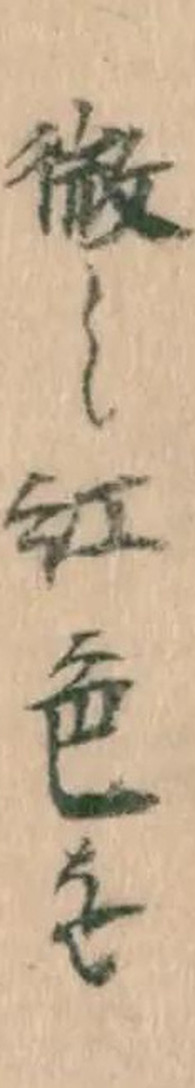微し紅色を
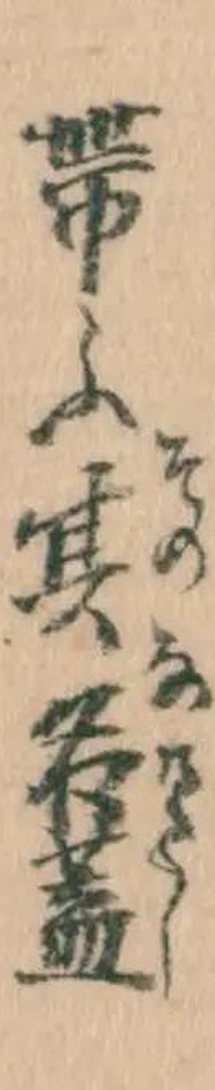帯ふ其名蓋
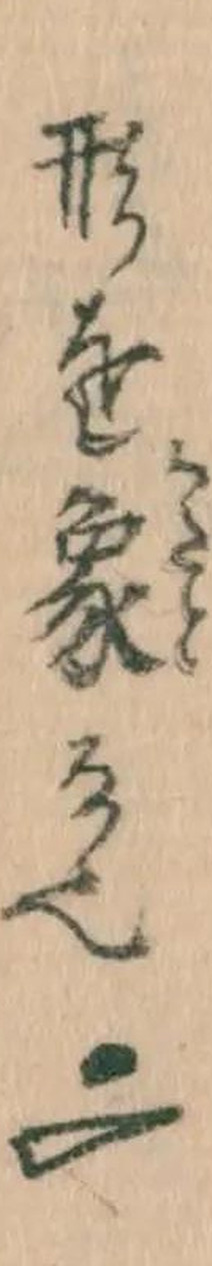形を象る也・▷
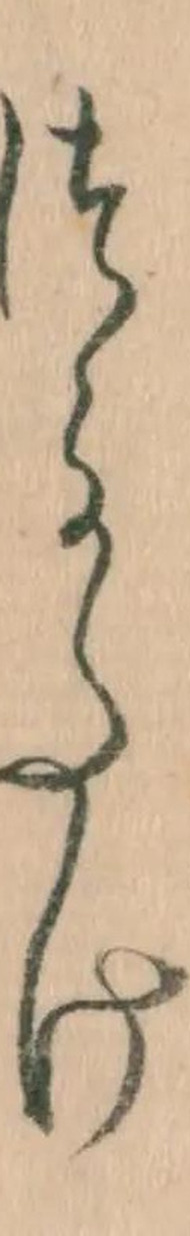つるたけ
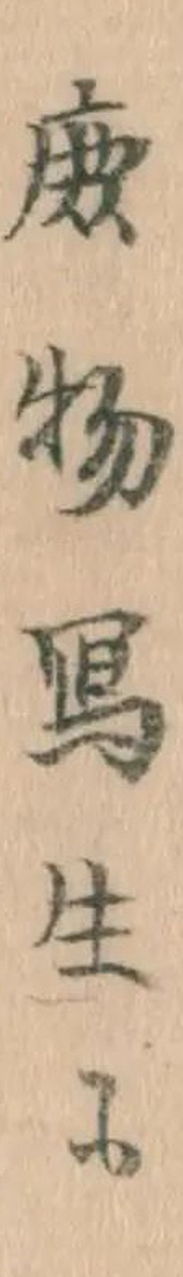庶物写生に
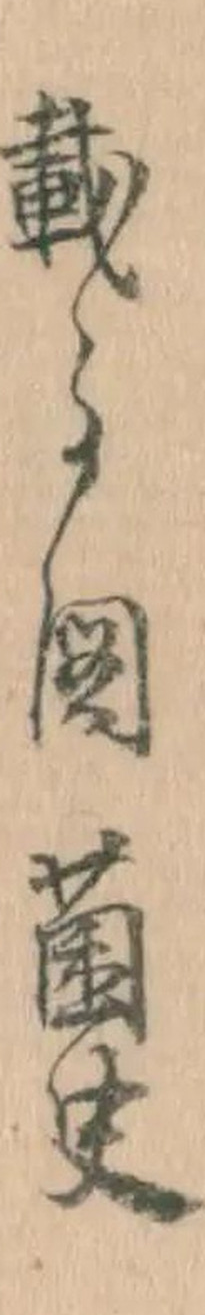載る図菌史
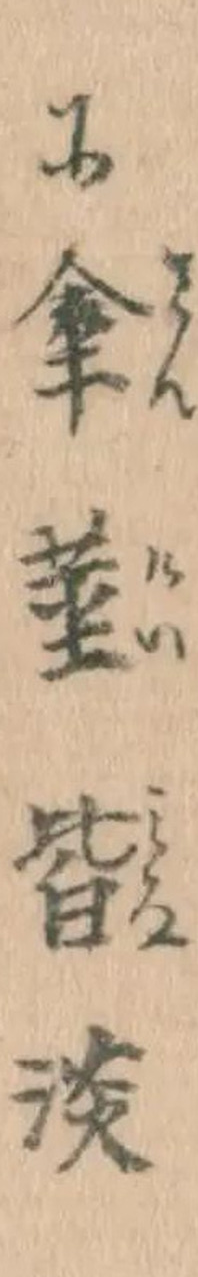に傘茎皆淡
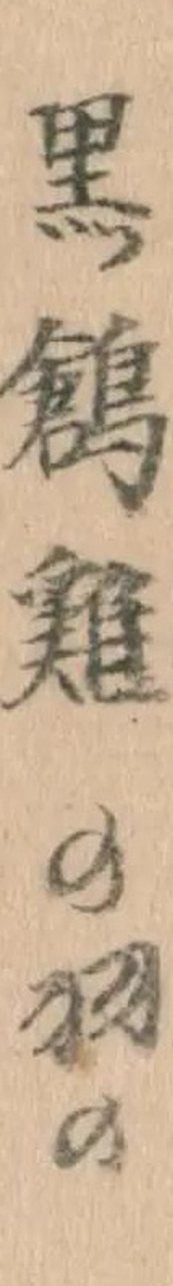黒鶬鶏の羽の
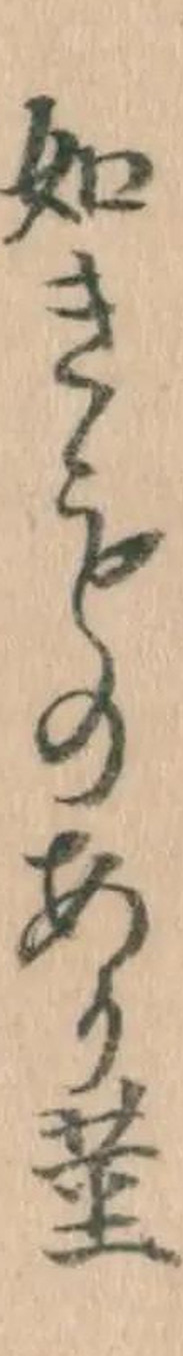如きものあり茎
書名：本草図譜. 巻58-60
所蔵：国立国会図書館 National Diet Library, JAPAN
